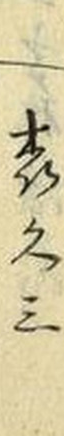森久三
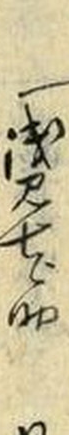浅見七郎助
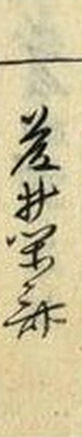藤井栄斎
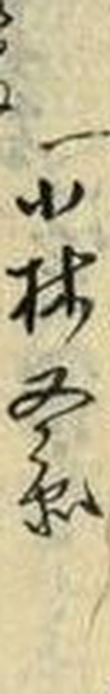小林又兵衛
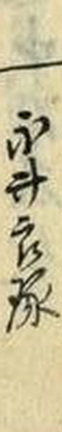永井良琢
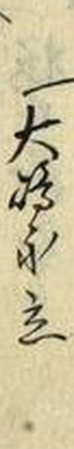大嶋永立
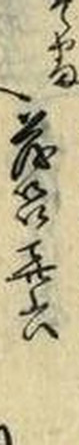茂呂喜六
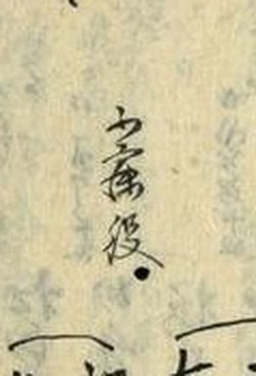不寝役
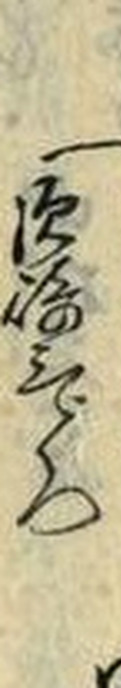須崎三郎右衛門
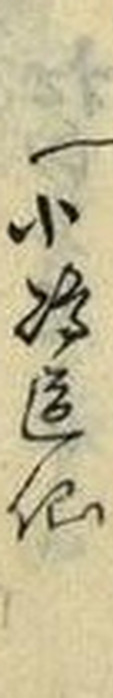小嶋道伯

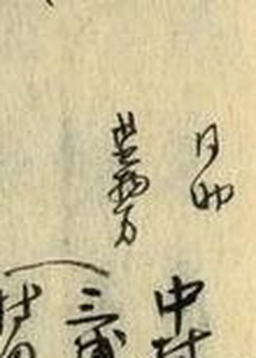御書物方
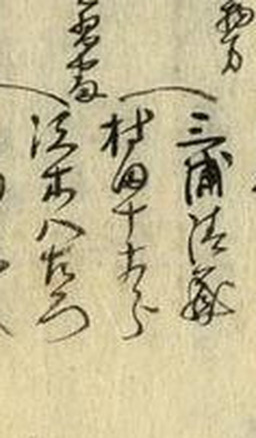村田清五郎
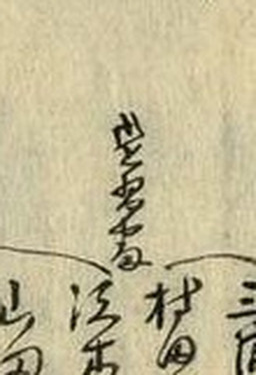御近習番
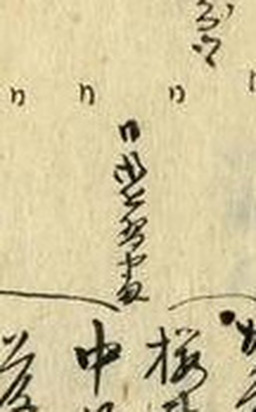同御近習番
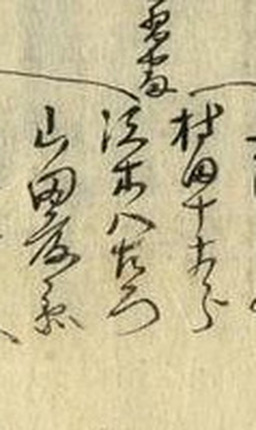沢木八左衛門
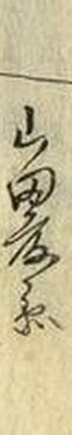山田藤兵衛
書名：少傅日録抄（斉承付側向頭取日記、在府）
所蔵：福井県文書館 Fukui Prefectural Archives
